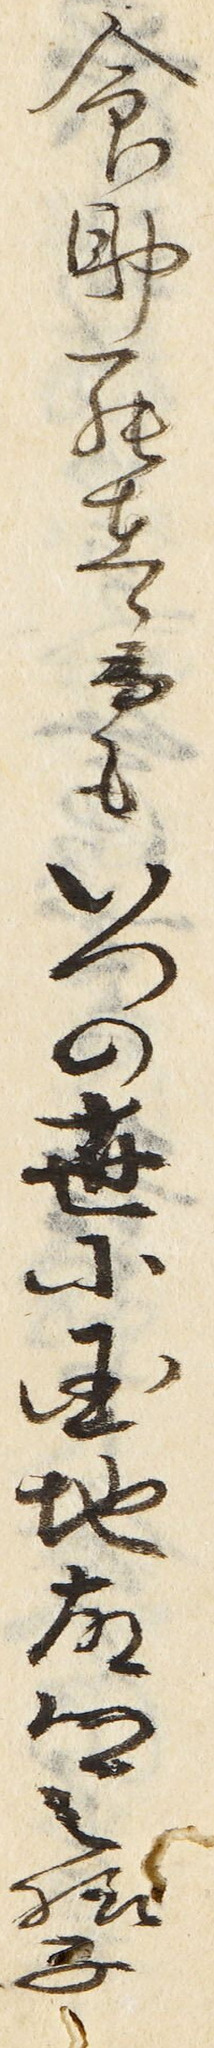命助罷在候而もいつの世に国地故郷之様子
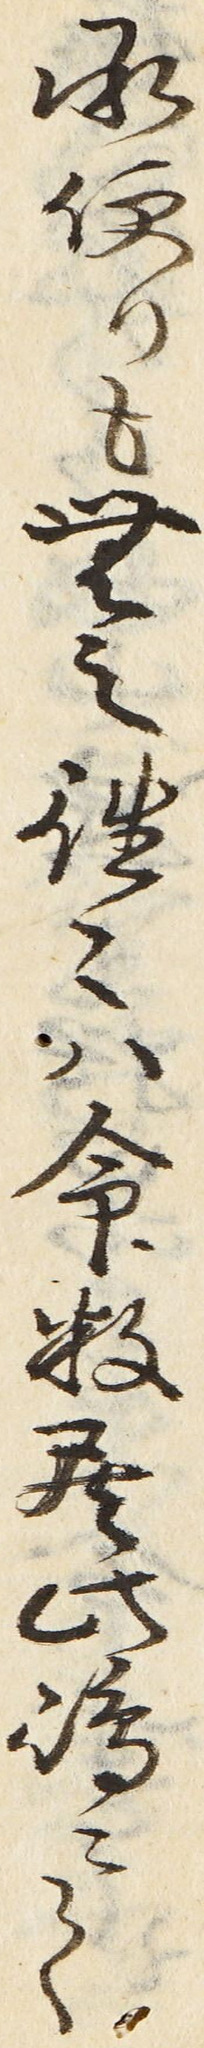承便りも無之往々ハ命数尽此嶋ニて
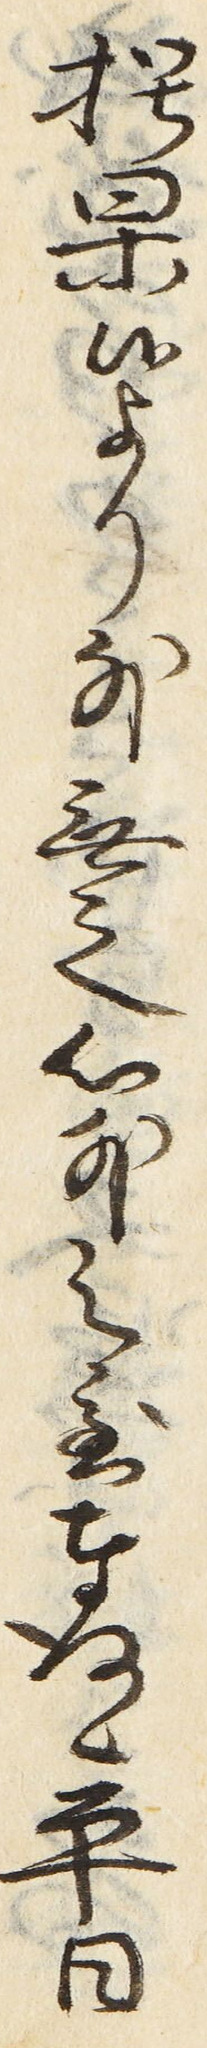枵果候より外無之心外之至奉存候平日
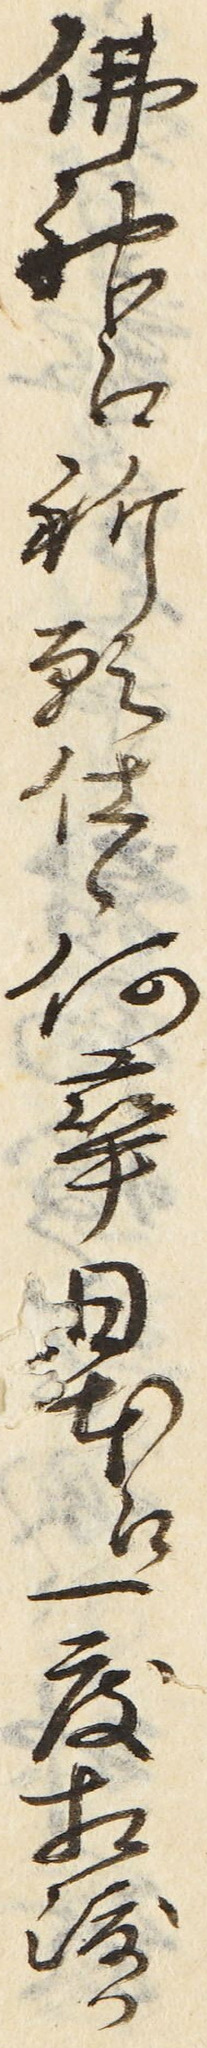仏神江祈願仕候何卒日本江一度相渡り
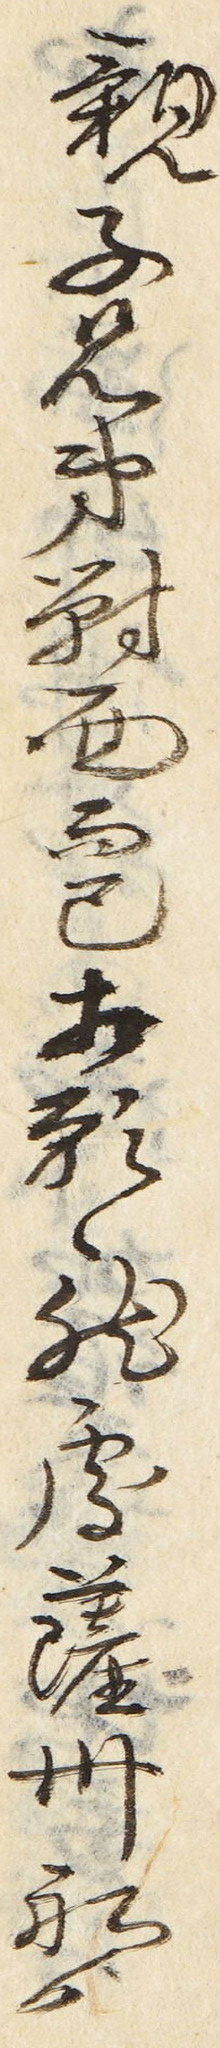親子兄弟対面而已相願候然処薩州船ゟ
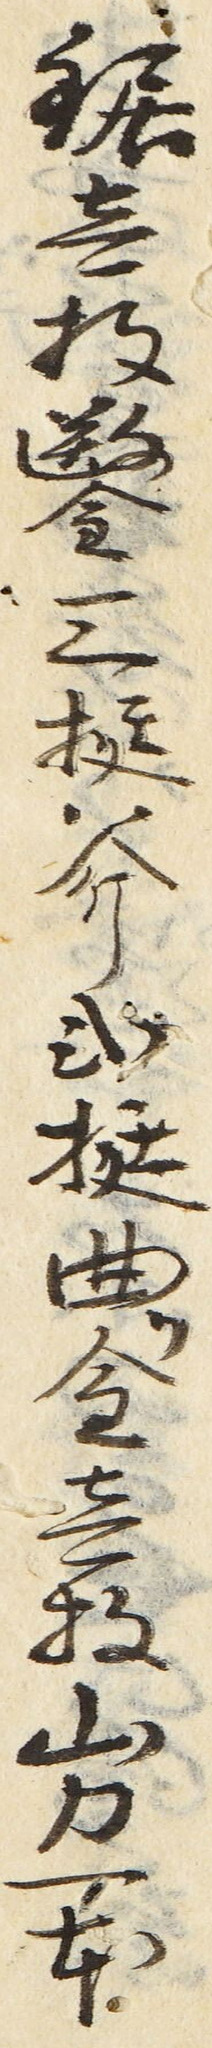鋸壱枚鑿三挺斧弐挺曲り金壱枚山刀一本
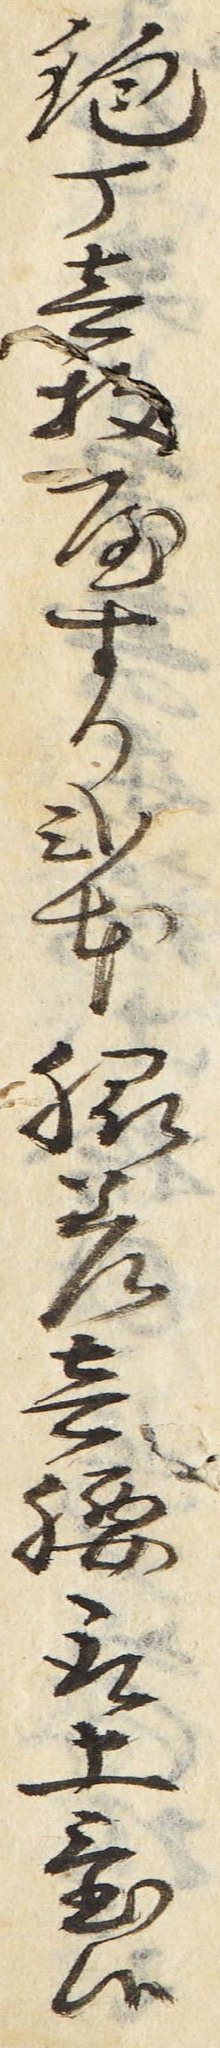鉋丁壱枚やすり弐本脇差壱腰取上置候

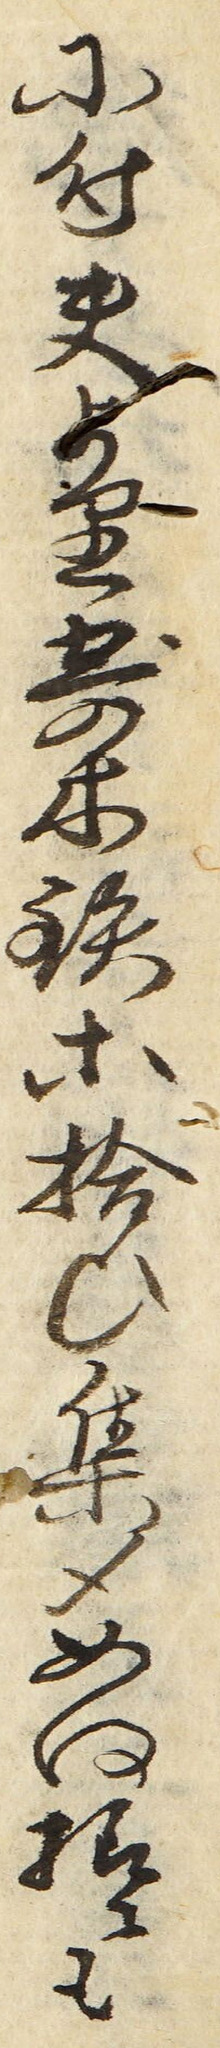に付夫より寄木鉄等拾ひ集メ如何様ニも
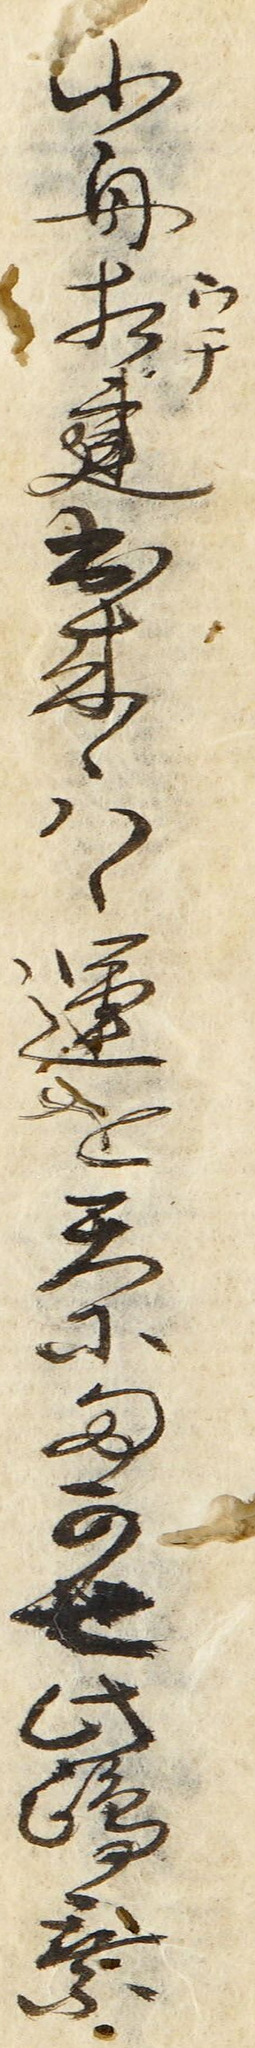小舟打建出来候ハヽ運を天にまかせ此嶋乗
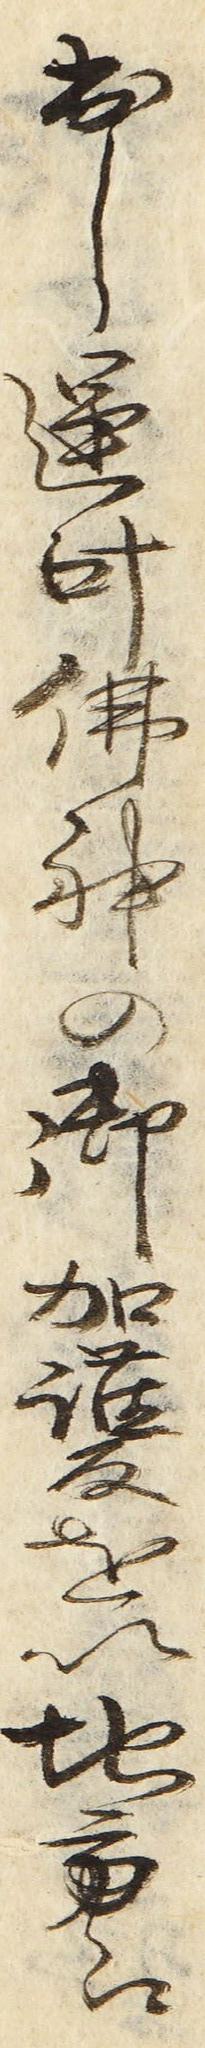出し運叶仏神の御加護を以地方江
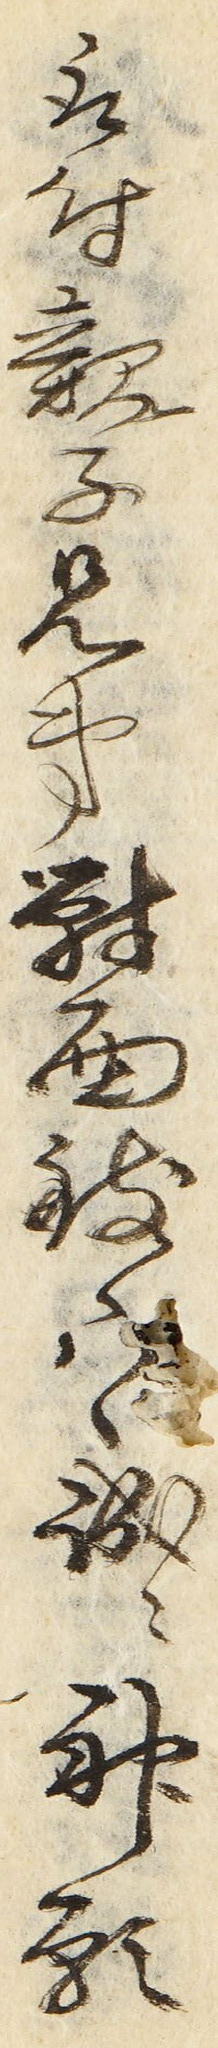取付親子兄弟対面致候ハヽ誠ニ神願
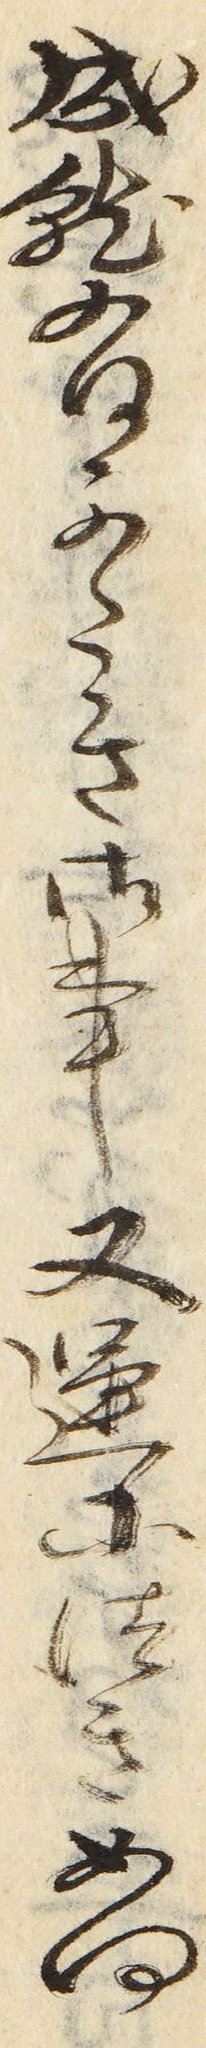成就有かたき御事又運につき如何
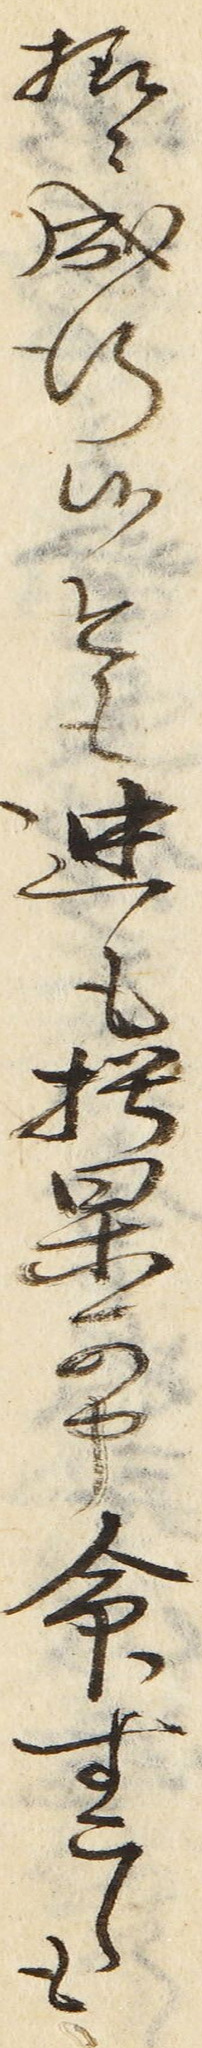様ニ成行候とも迚も枵果可申命すこしも
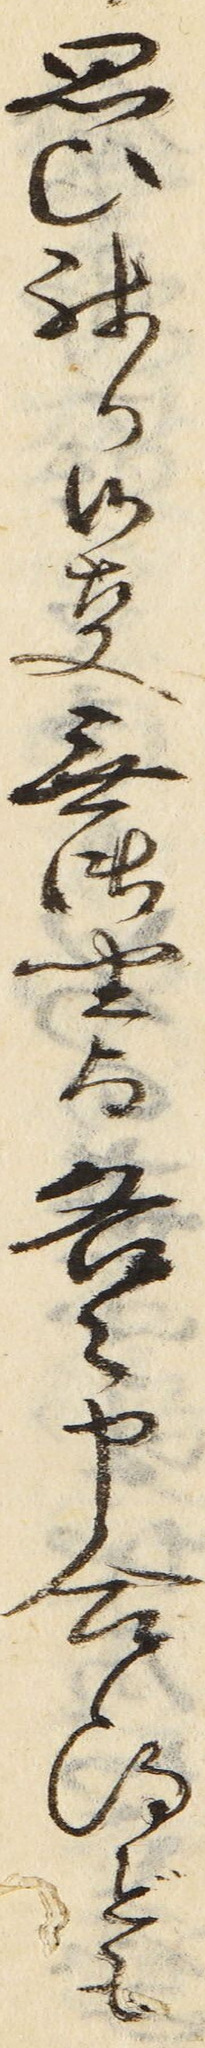思ひ残り候事無御座与各々申合候得ども
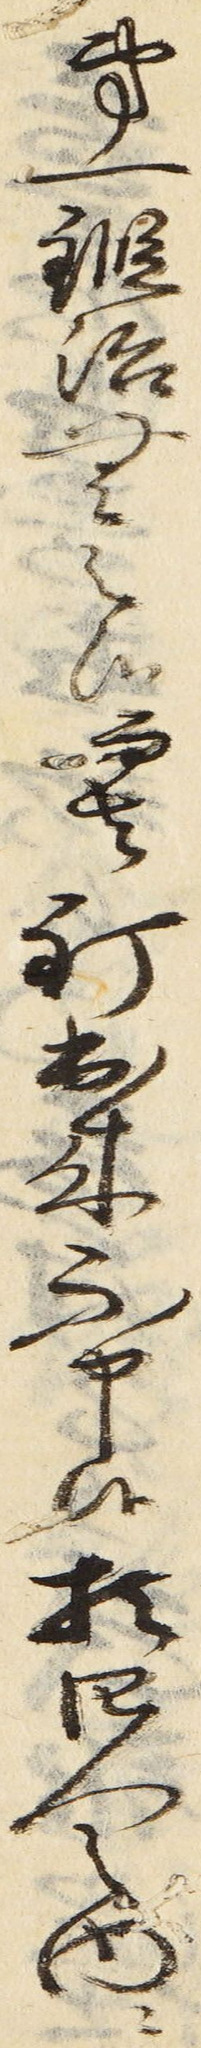第一鍛冶無之候而者釘出来不申候拾四人之内ニ
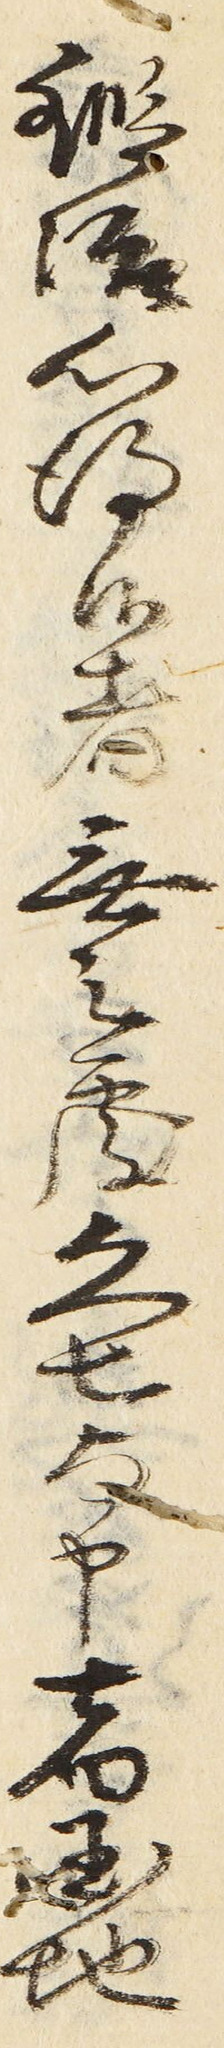鍛冶心得候者無之処久七与申者国地
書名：漂流一件上書
